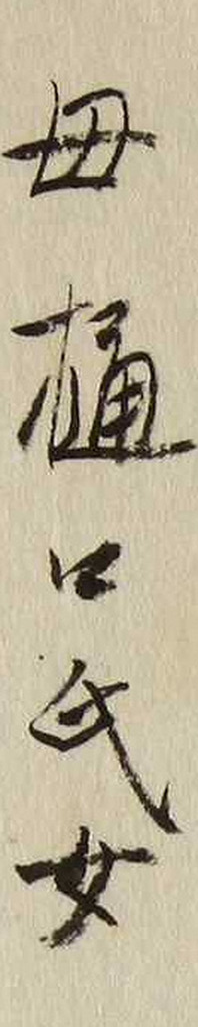母樋口氏女
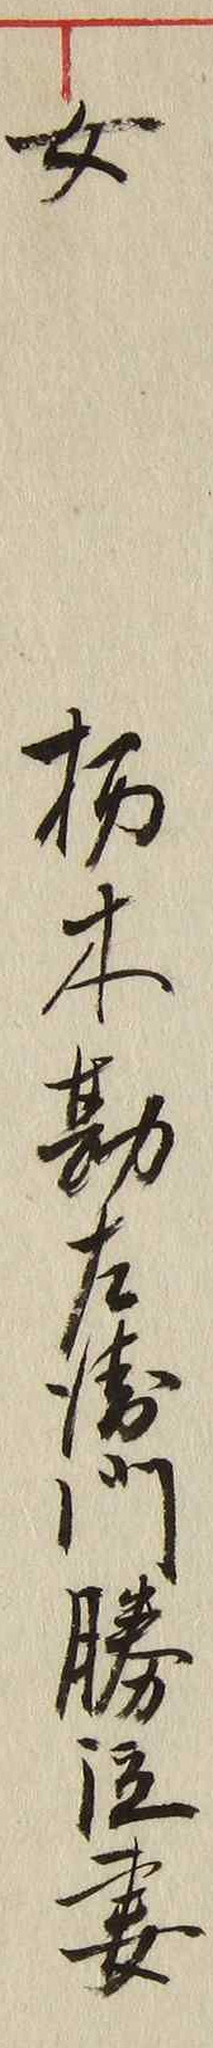女栃木勘左衛門勝注妻
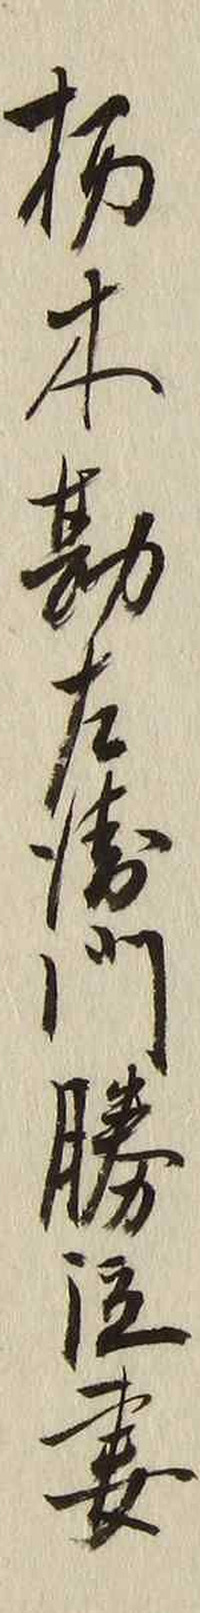女栃木勘左衛門勝注妻
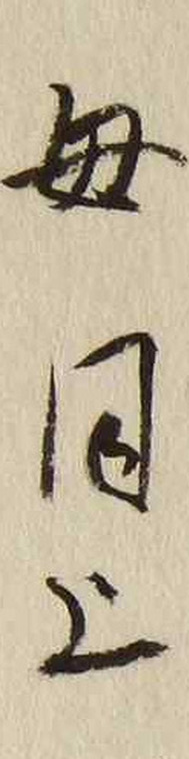母同上

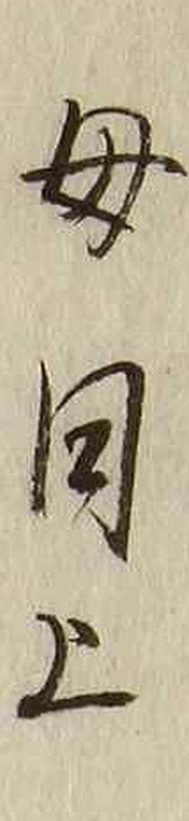母同上
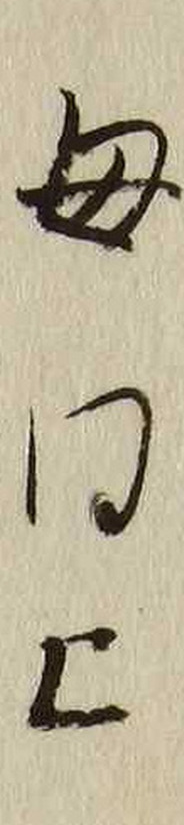母同上
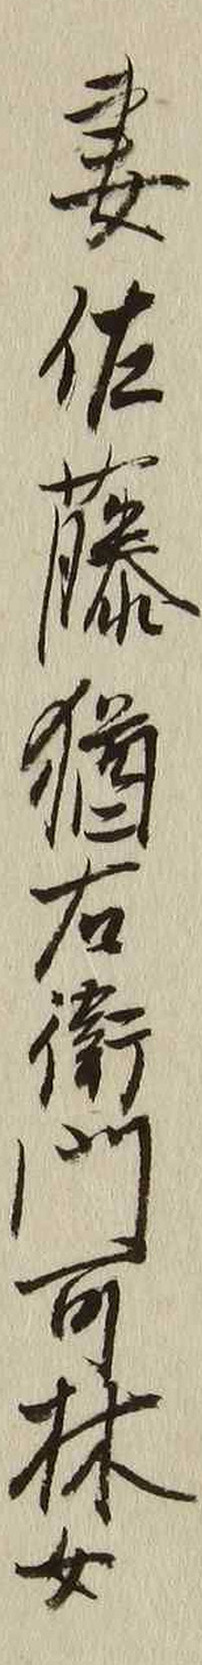妻佐藤猶右衛門可林女
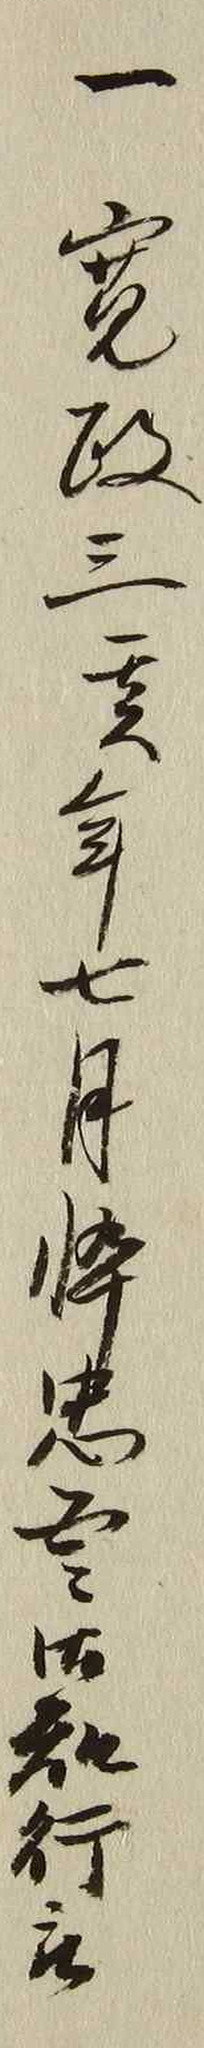一寛政三亥年七月忰忠吾御知行被
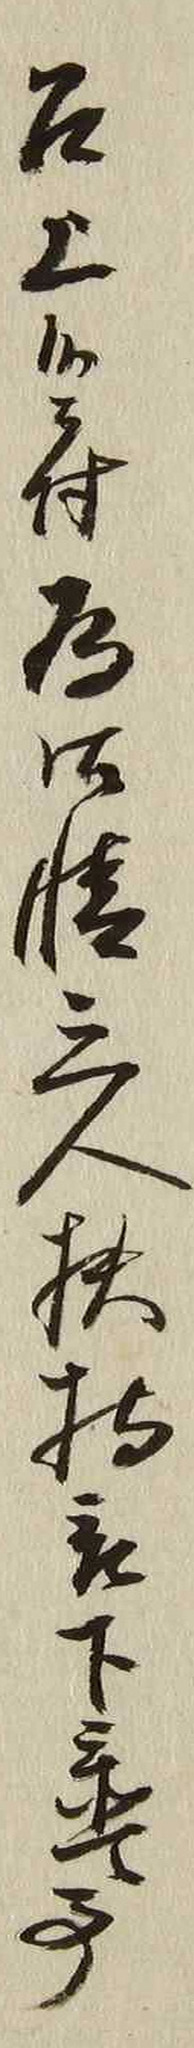召上候ニ付為御情三人扶持被下置候事
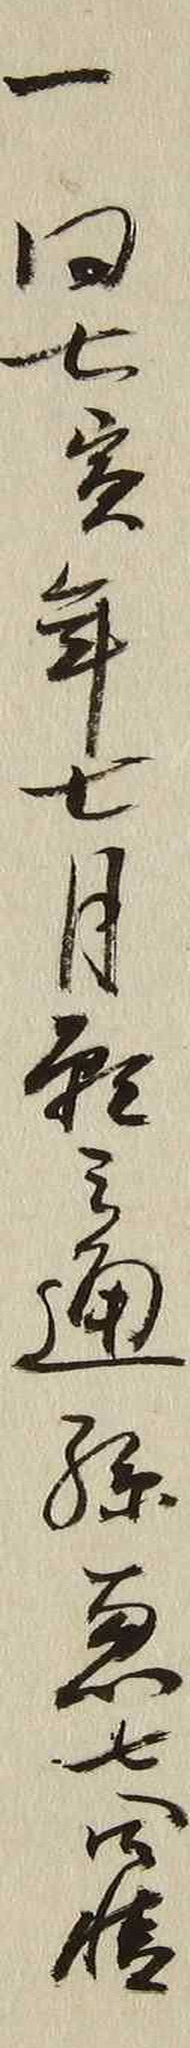一同七寅年七月願之通孫恵七へ御情
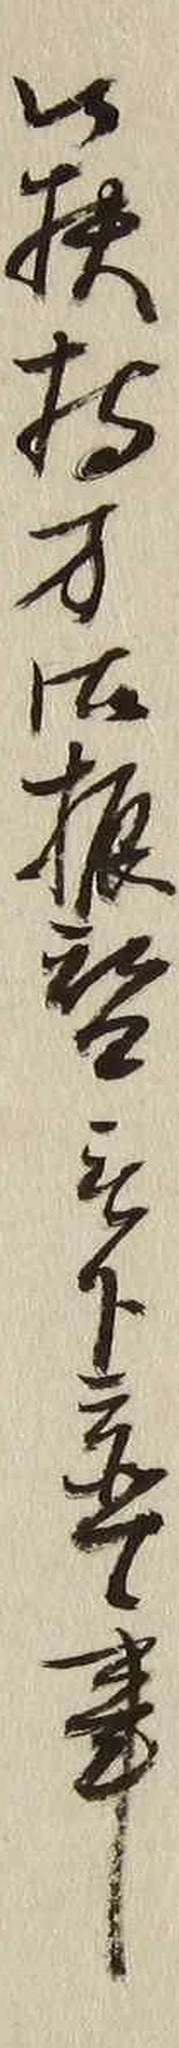御扶持方御振替被下置候事
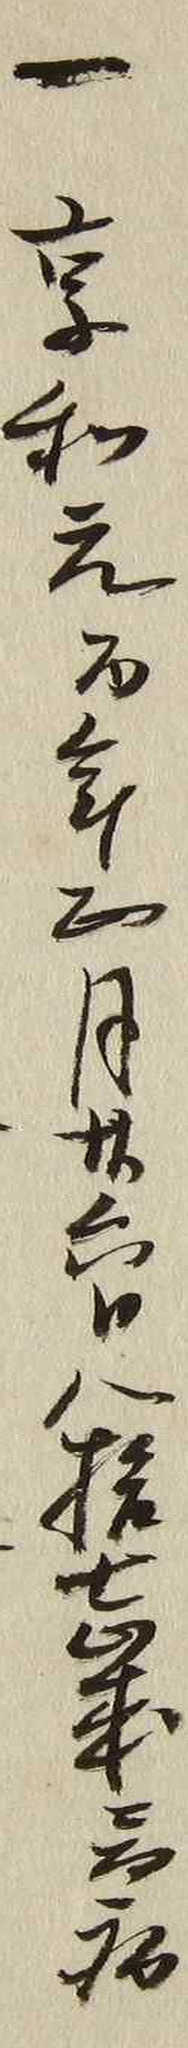一享和元酉年正月廿六日八拾七歳ニ而病
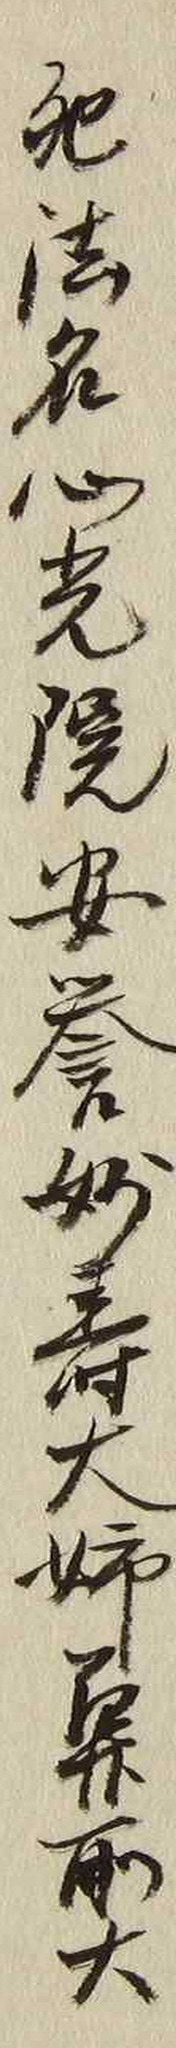死法名心光院安誉妙寿大姉葬所大
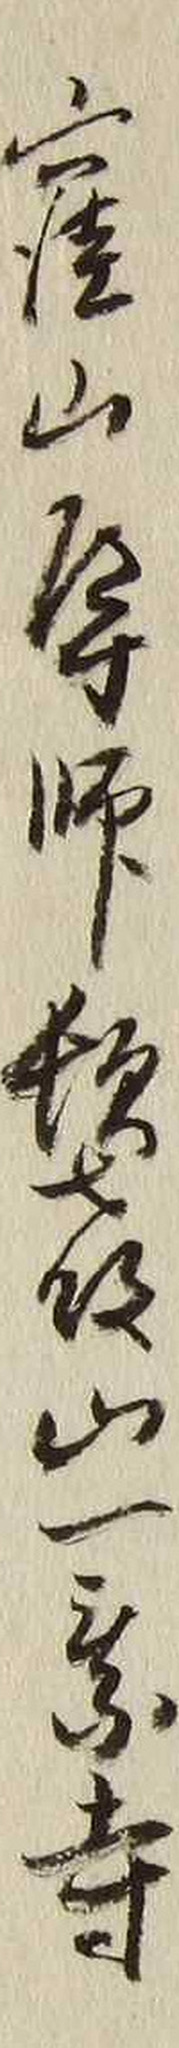窪山導師頓教山一乗寺
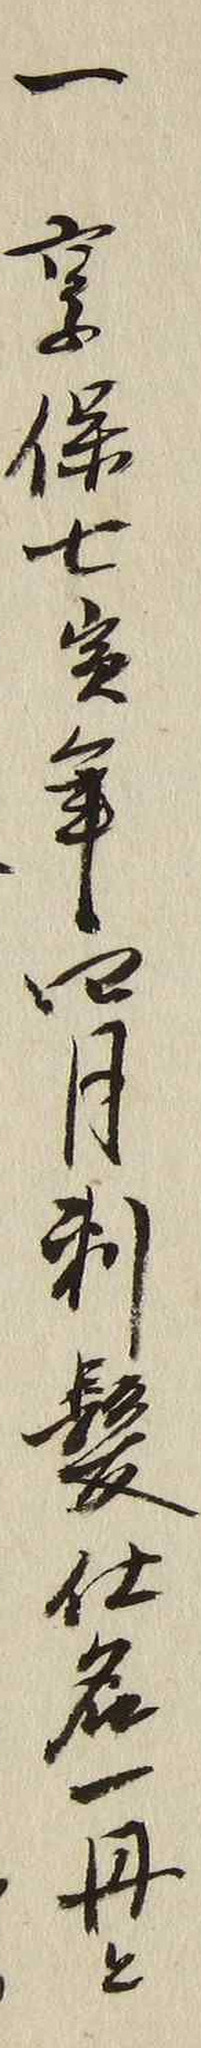一享保七寅年四月剃髪仕名一丹と
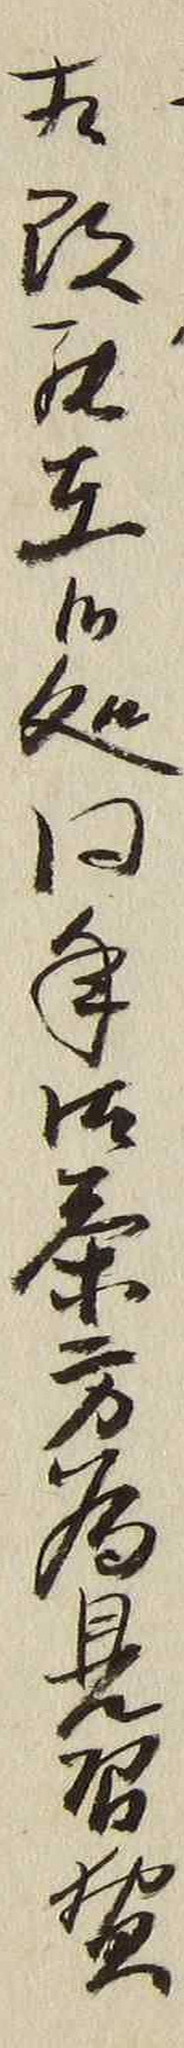相改罷在候処同年御茶方為見習費
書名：諸士系譜　巻之349　も之部5
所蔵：会津若松市立会津図書館
